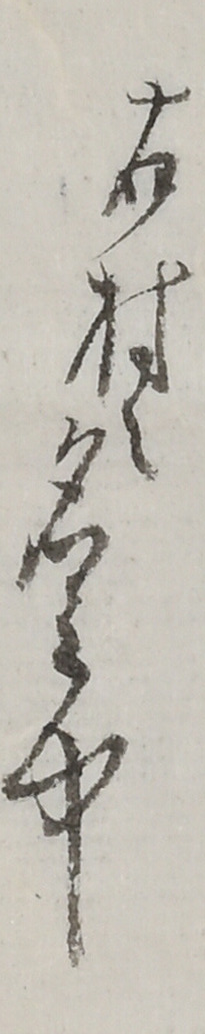右村々名主中

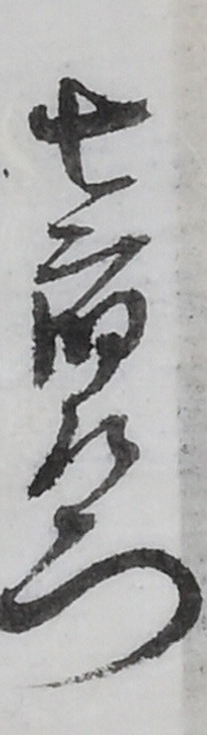七郎左衛門
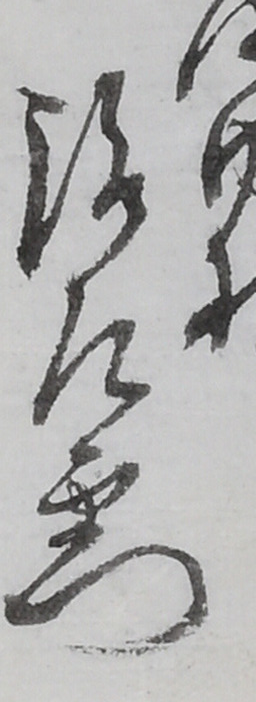清左衛門
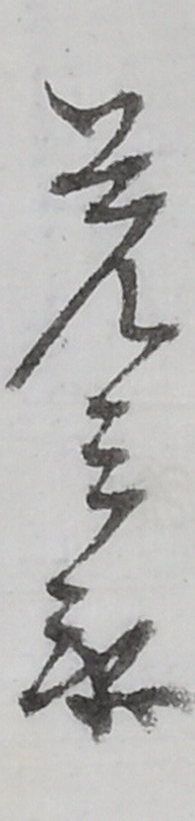覚兵衛
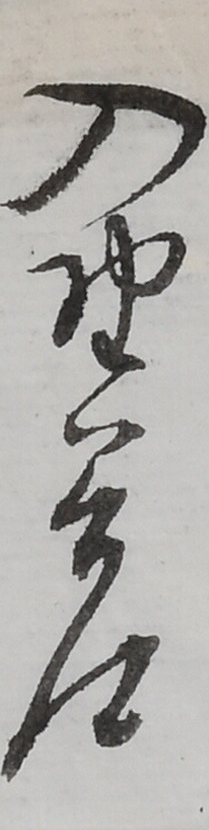入野谷郷
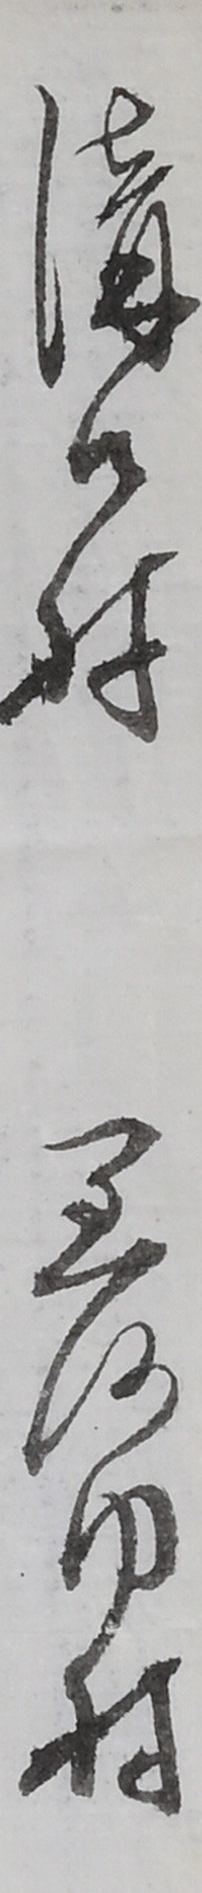溝口村黒河内村
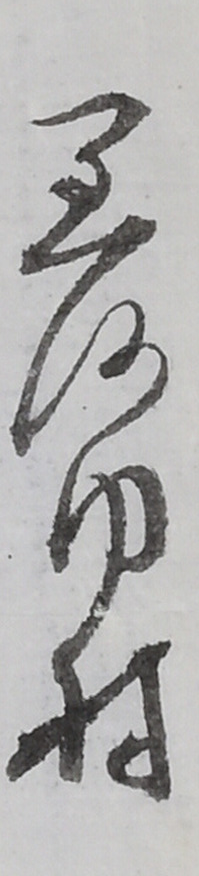黒河内村
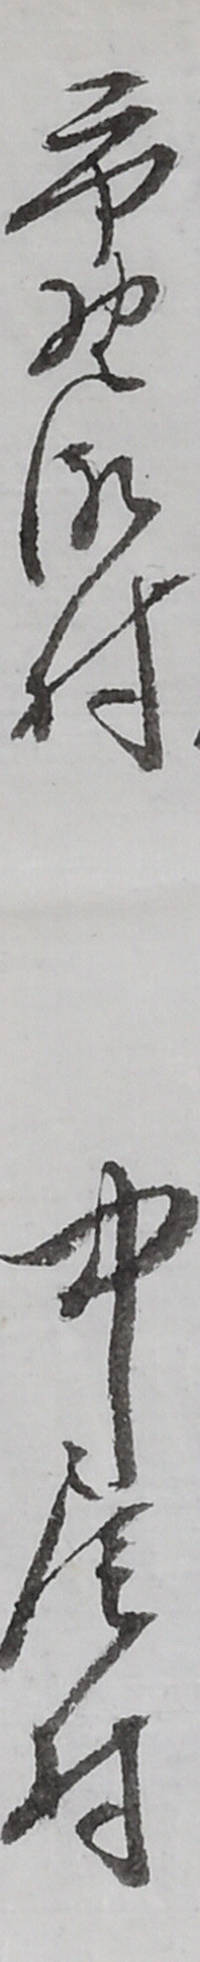市野瀬村中尾村
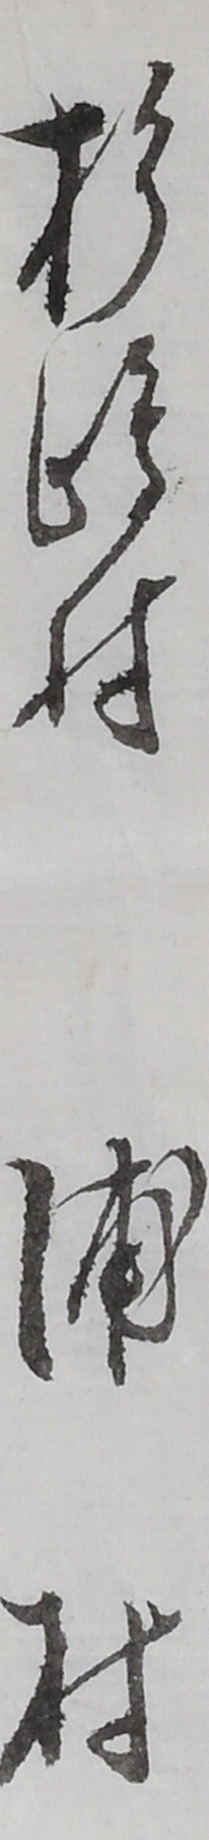杉嶋村浦村
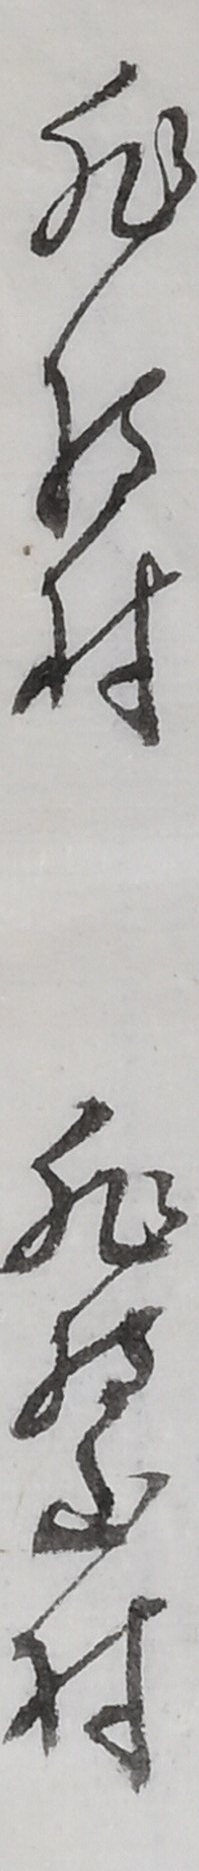非持村非持山村
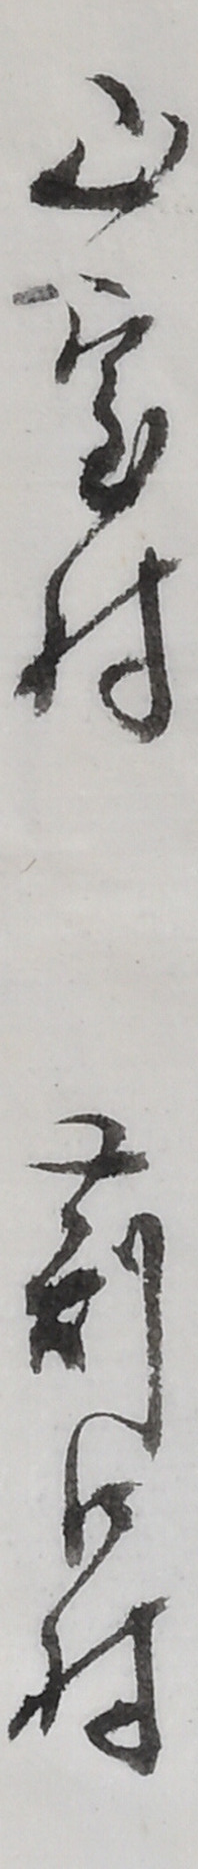山室村荊口村
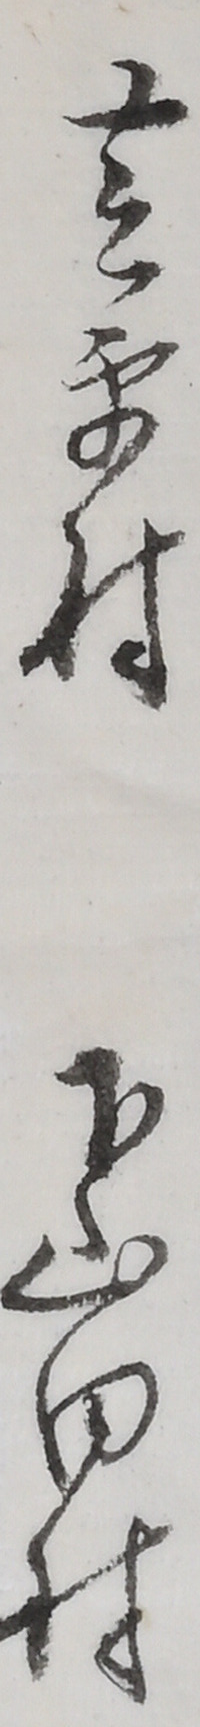芝平村下山田村
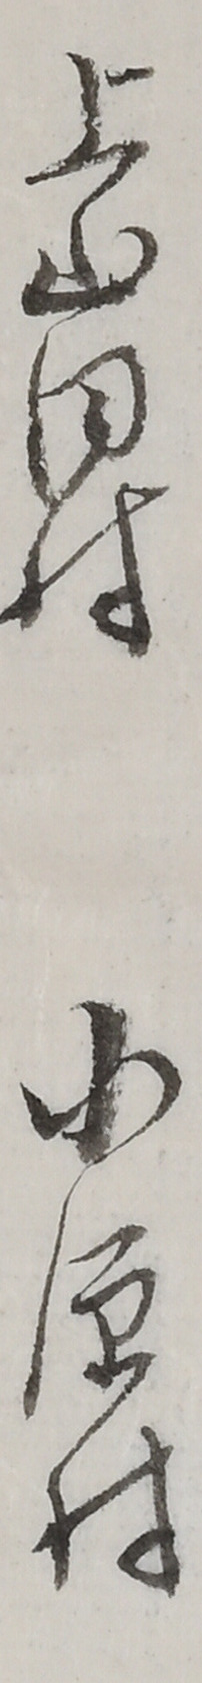上山田村小原村
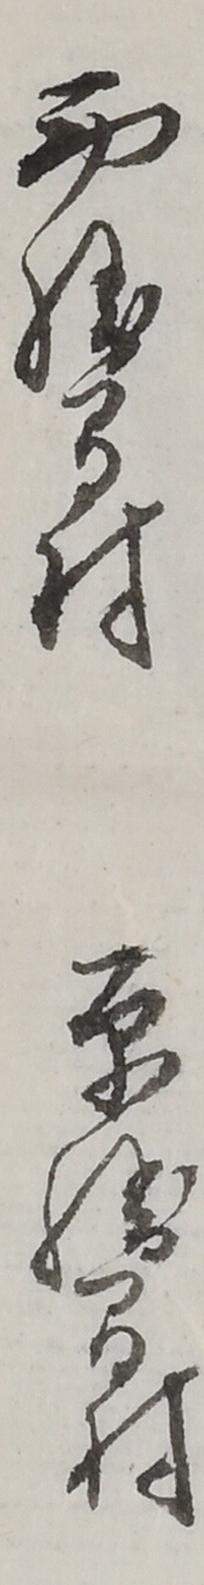西勝間村原勝間村
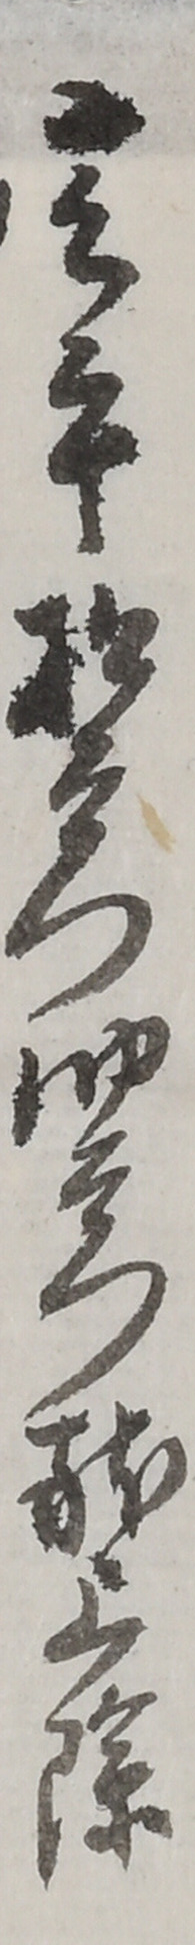芝平杉右衛門助右衛門献上除
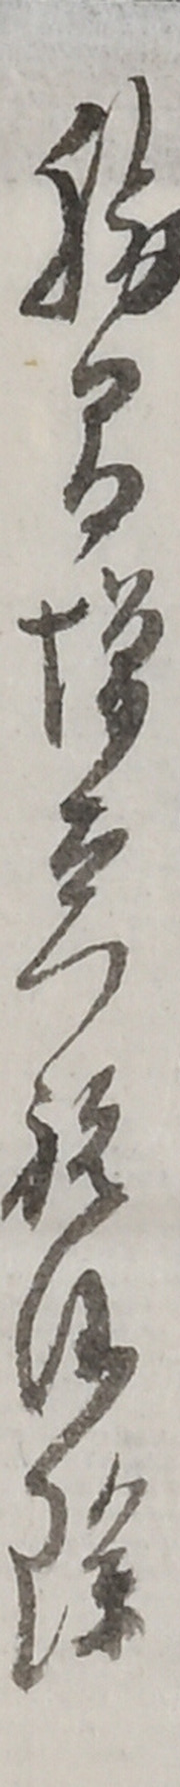勝間増右衛門祝儀除
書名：百五拾年御祝御用手控
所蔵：伊那市立高遠町図書館・合同会社AMANE
